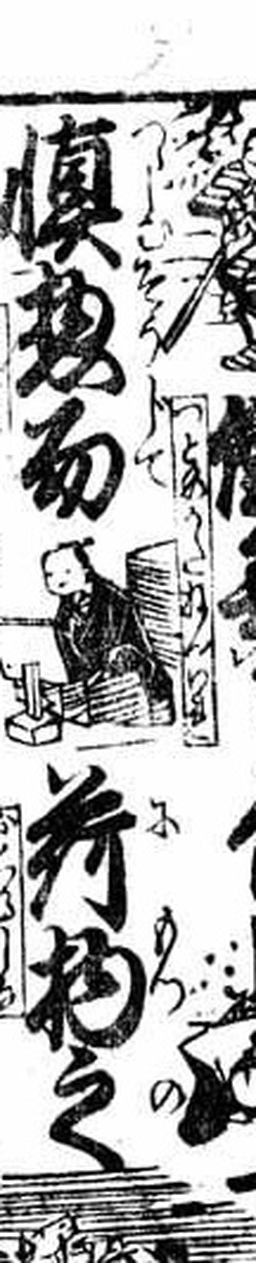慎惣而荷物之
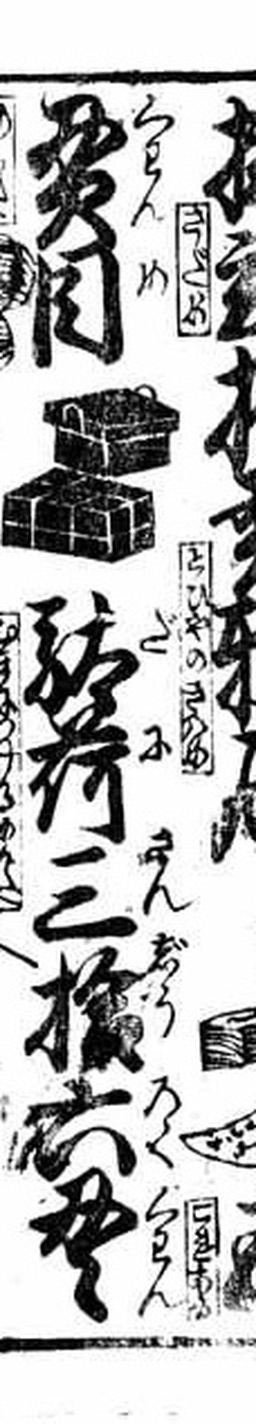貫目駄荷三拾六貫
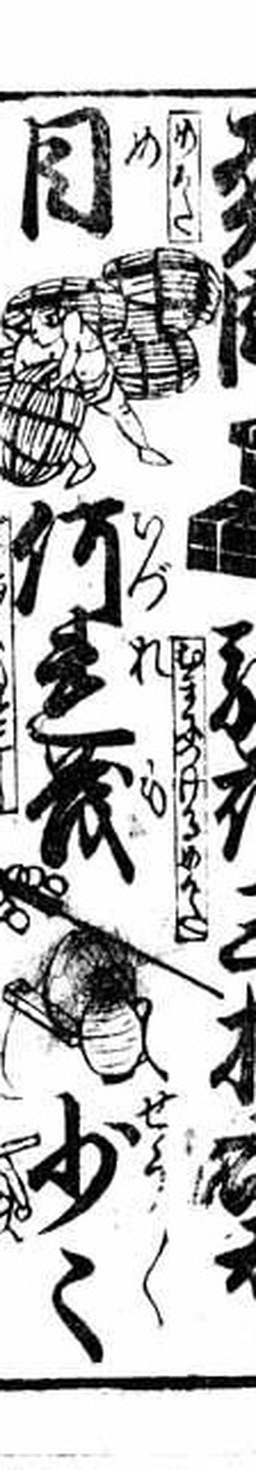目何連茂少々

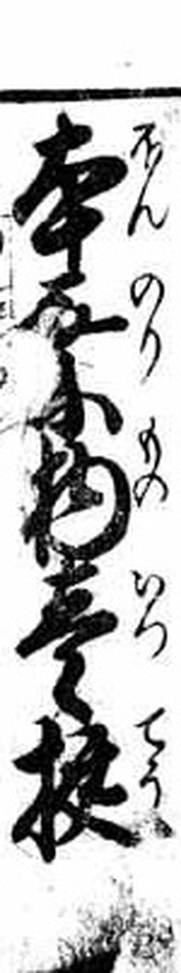本乗物壱挺
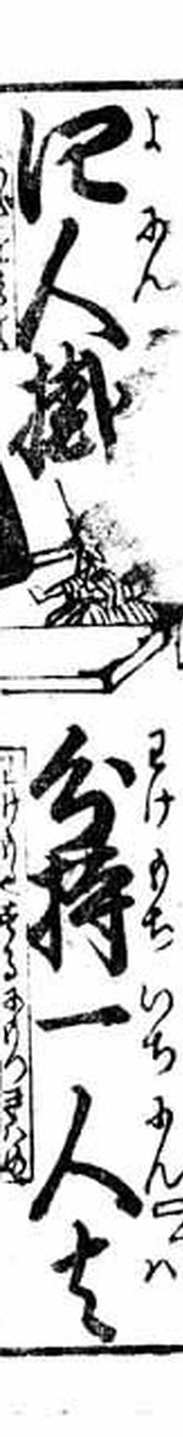四人掛分持一人者
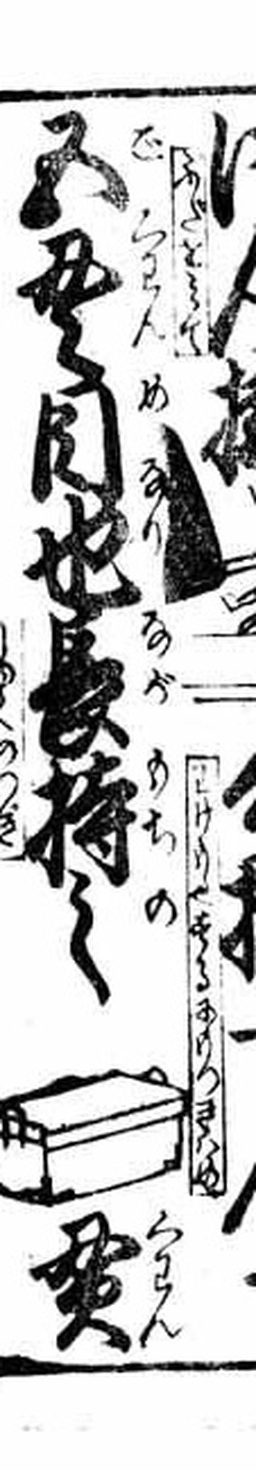五貫目也長持之貫
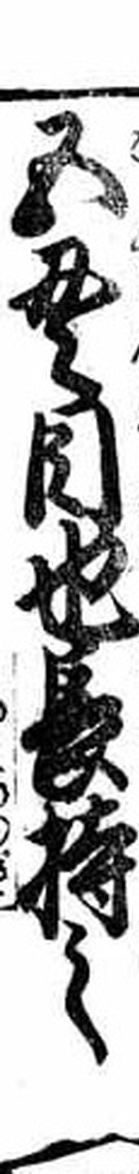五貫目也長持之貫
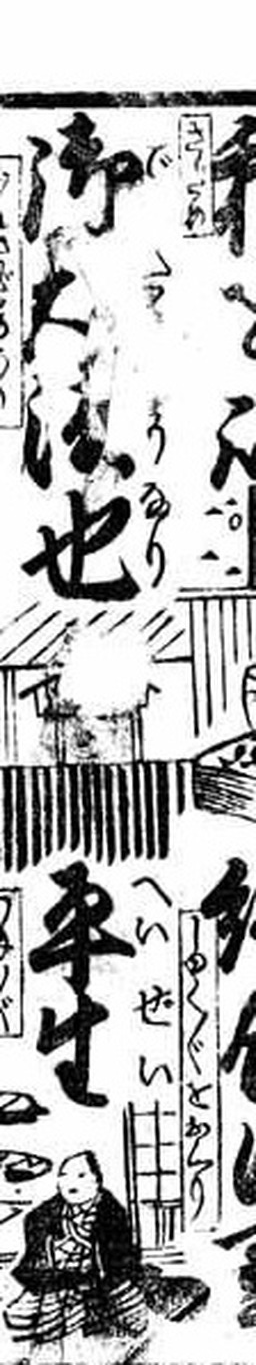御大法也平生

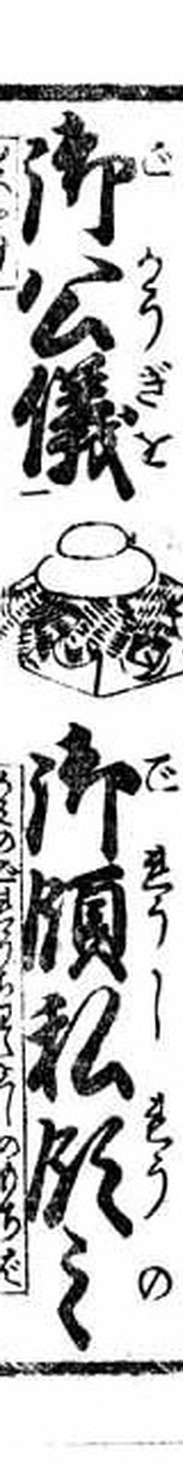御公儀御領私領之
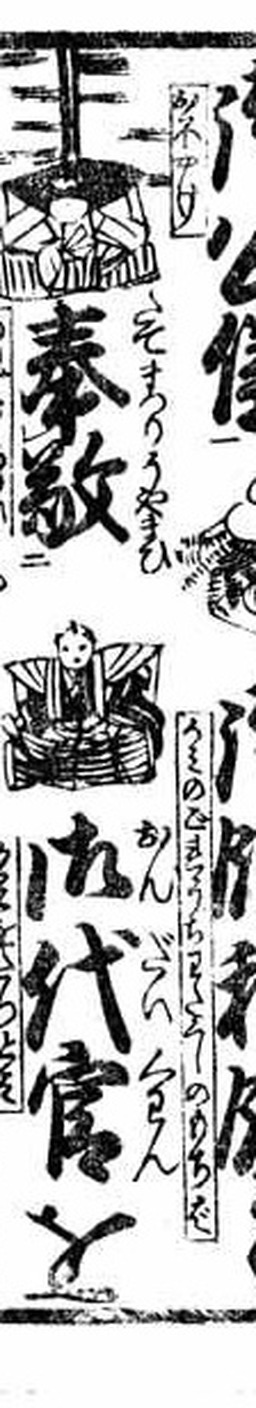奉敬御代官を
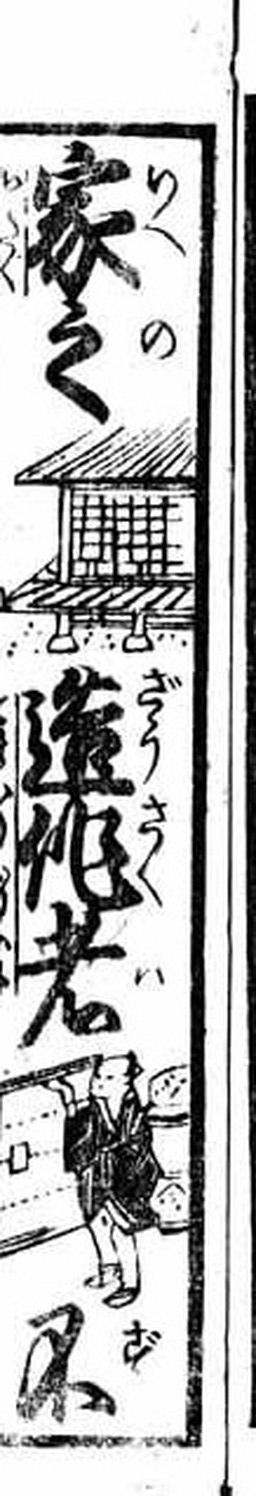家之造作者不
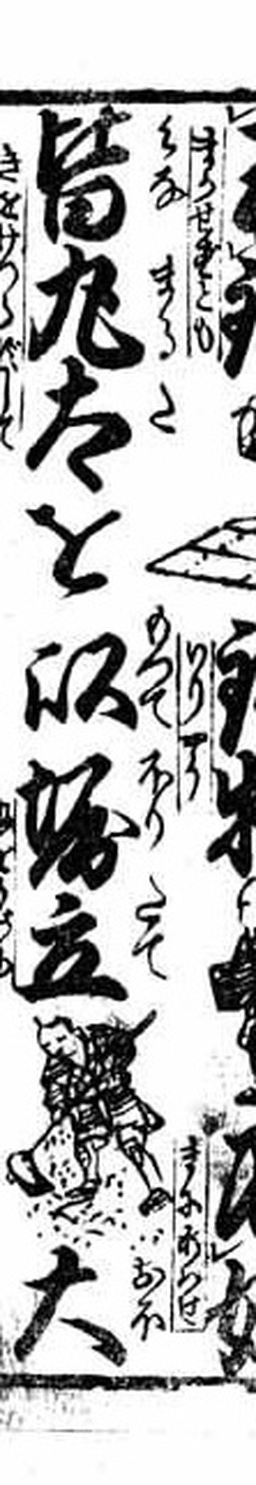皆丸太を以掘立大
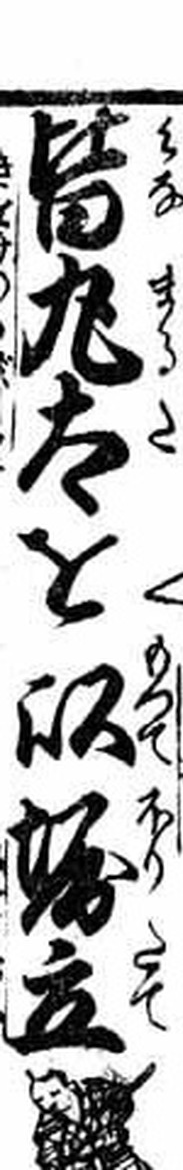皆丸太を以掘立大

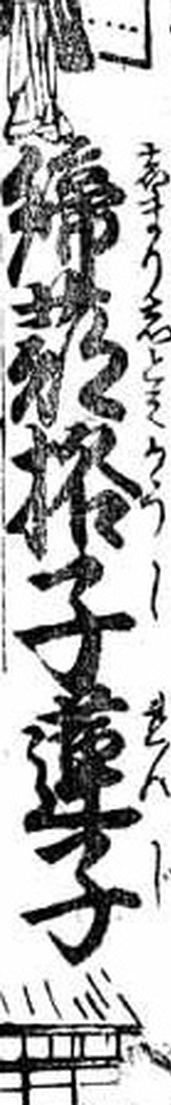締蔀格子蓮子

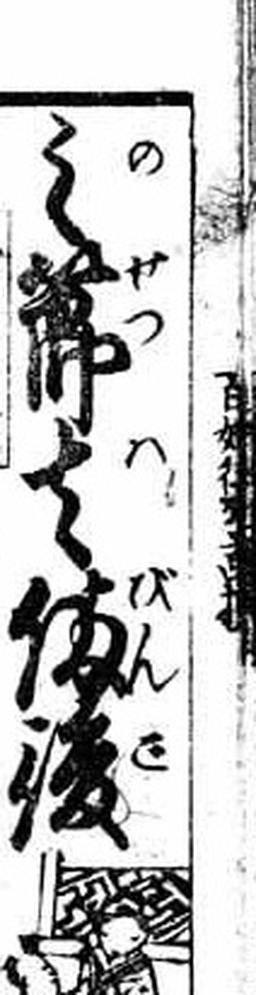之節者備後表減
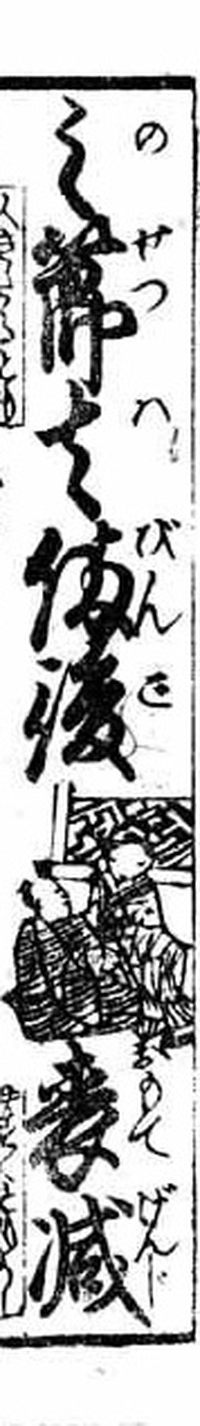之節者備後表減
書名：百姓往来画抄
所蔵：東京学芸大学教育コンテンツアーカイブ
